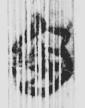○（因）
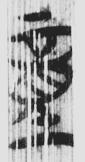童（踵）
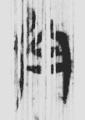於
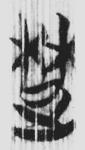楚
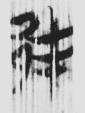邦
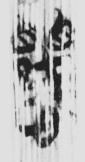懼
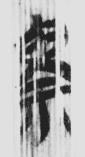○（鬼）
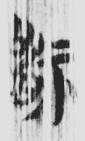神
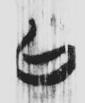㠯（以）
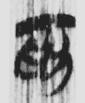爲
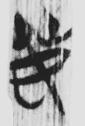○（怒）
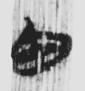甶（思）
